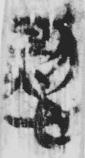惻（賊）
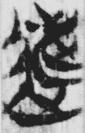逃（盜）
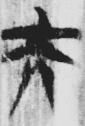夫
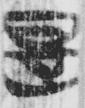是
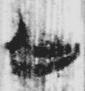㠯（以）
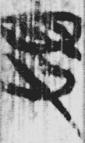○（得）
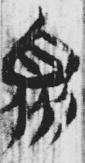眾
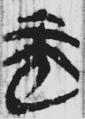而
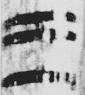王
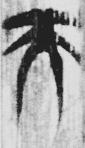天
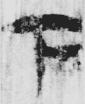下
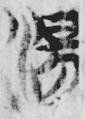湯
